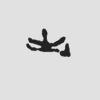青
